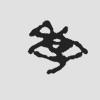季
